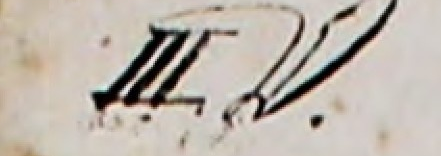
III V.
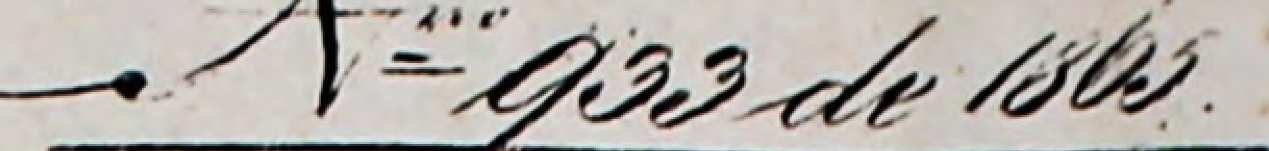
Nro 933 de 1865.
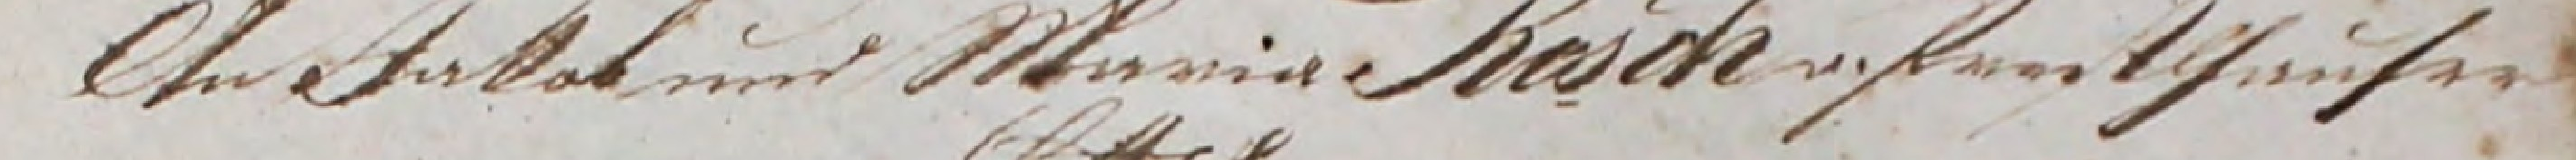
An Jakob und Maria Resch ab Prestlhauser
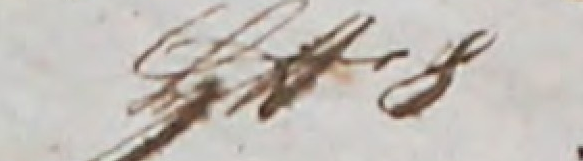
H? 8
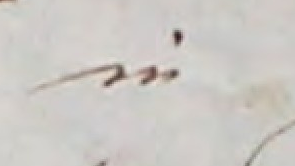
in
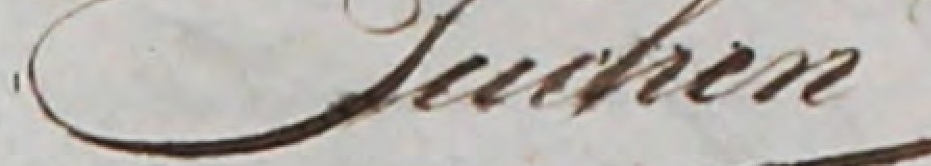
Puchen
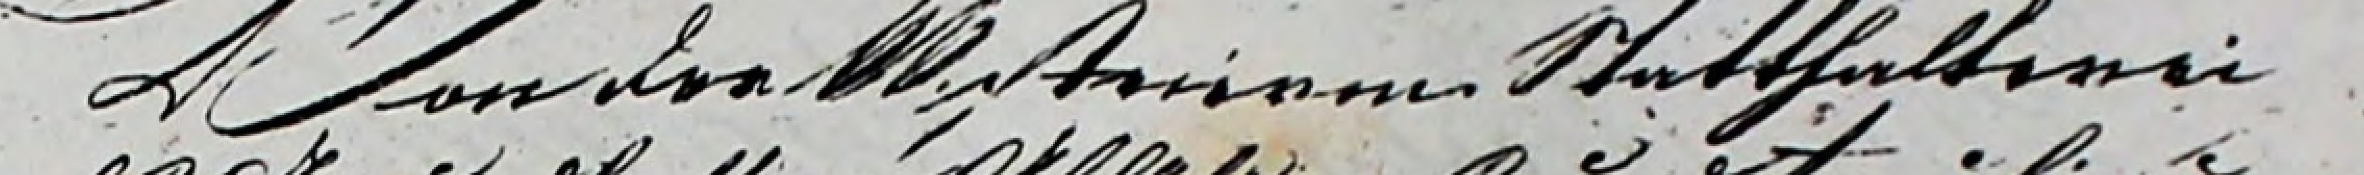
Von der kk. steierm. Statthalterei
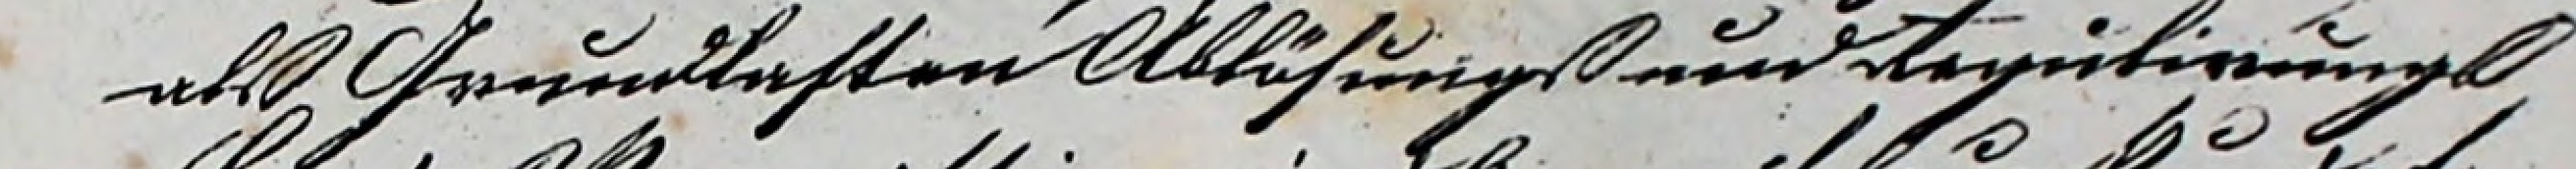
als Grundlasten Ablösung und Regulirungs
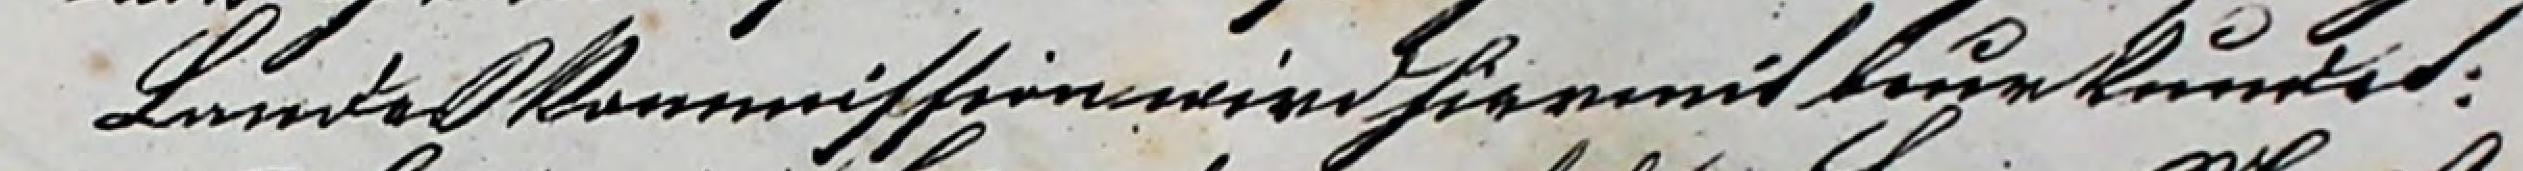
Landeskommission wird hiermit beurkundet:
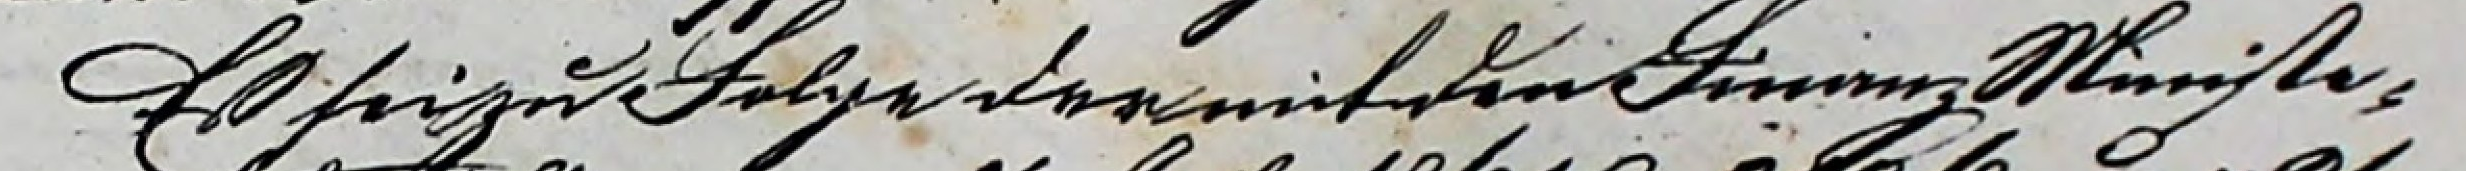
Es sei zu Folge der mit den Finanz Ministe„
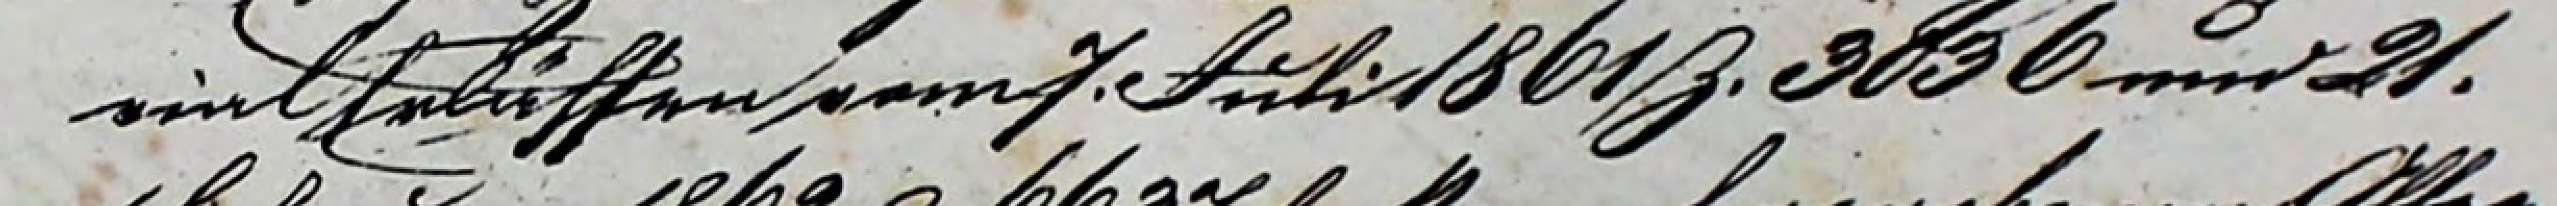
rial Erlässen vom 7. Juli 1861 Z. 3036 und 21.
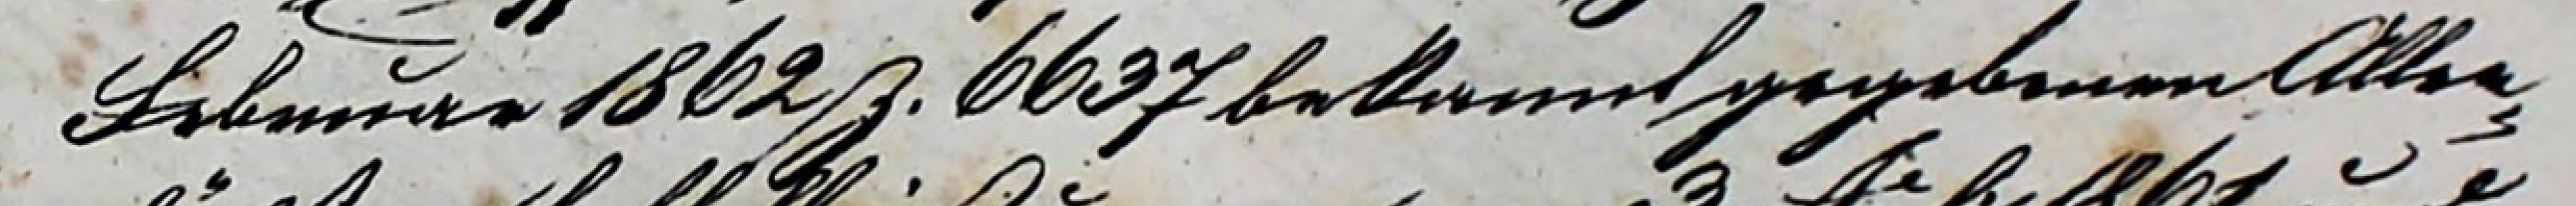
Februar 1862 Z. 6637 bekannt gegebenen Aller„
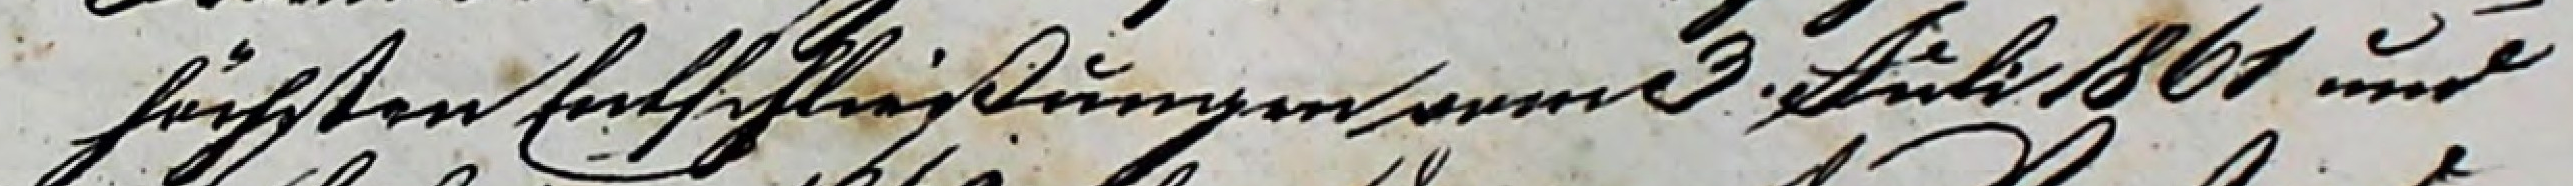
höchsten Entschließungen vom 3. Juli 1861 und
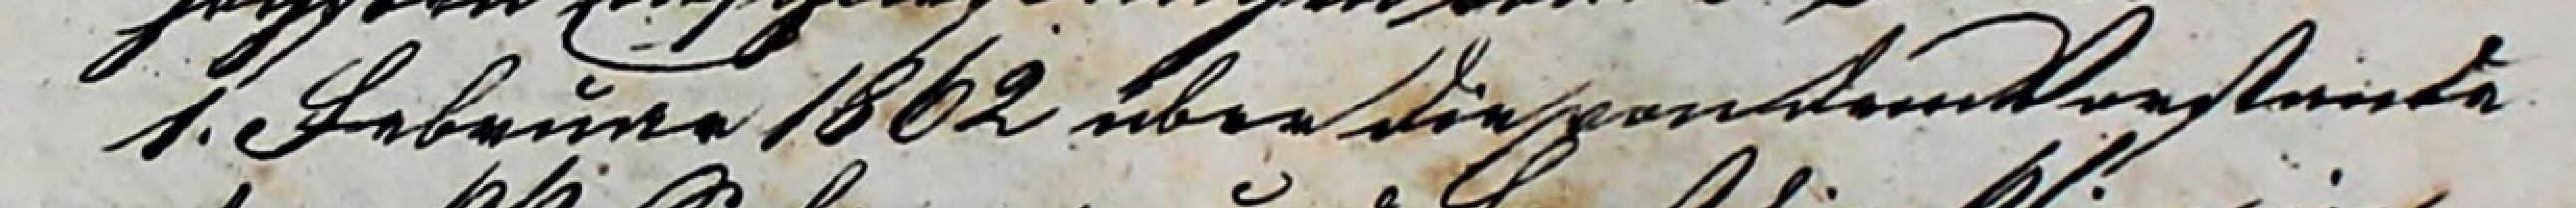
1. Februar 1862 über die von dem Vorstande
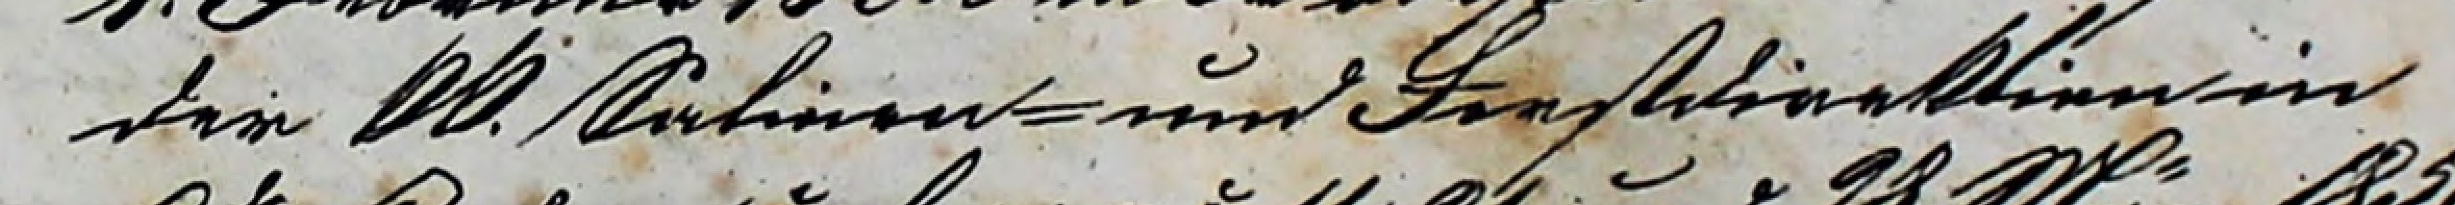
der kk. Salinen= und Forstdirektion in
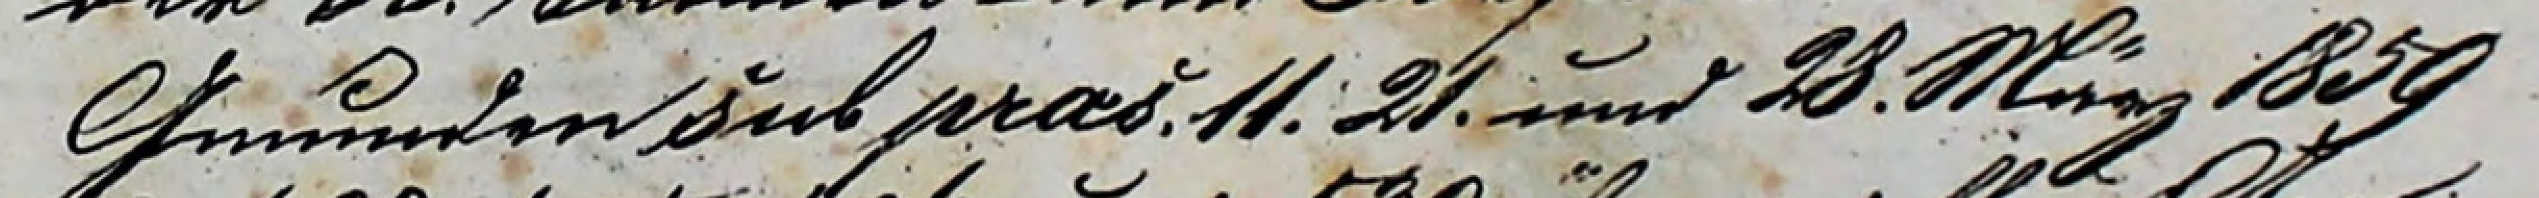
Gmunden aus pras. 11. 21. und 28. März 1859
